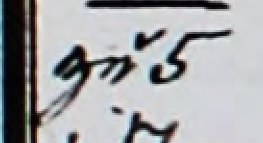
zu 5
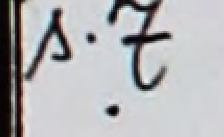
s. 7
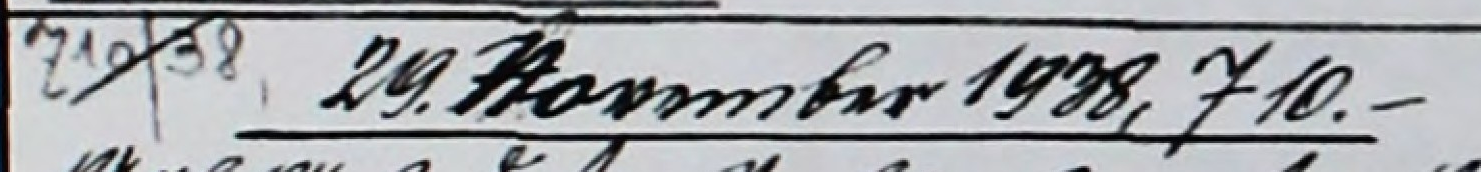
710/38 29. November 1938, 710.-
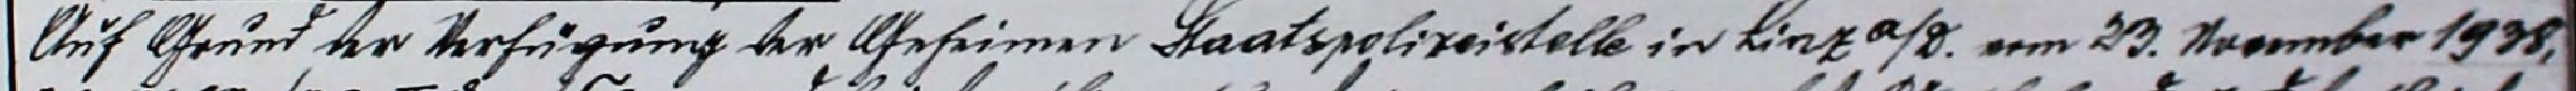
Auf Grund der Verfügung der Geheimen Staatspolizeistelle in Linz a/D. vom 23. November 1938,
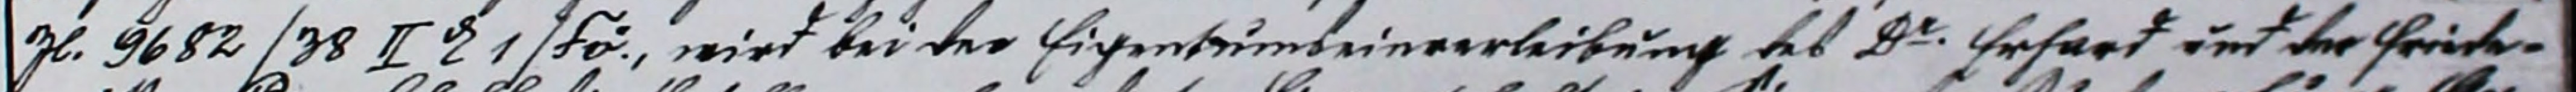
zl. 9682/38 II d 1/Fö., wird bei der Eigentumseinverleibung des Dr. Erhard und der Friede=
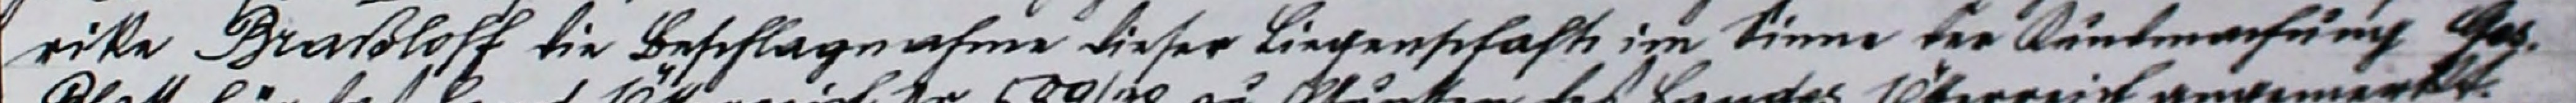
rike Braßloff die Beschlagnahme dieser Liegenschafte im Sinne der Kundmachung Ges,
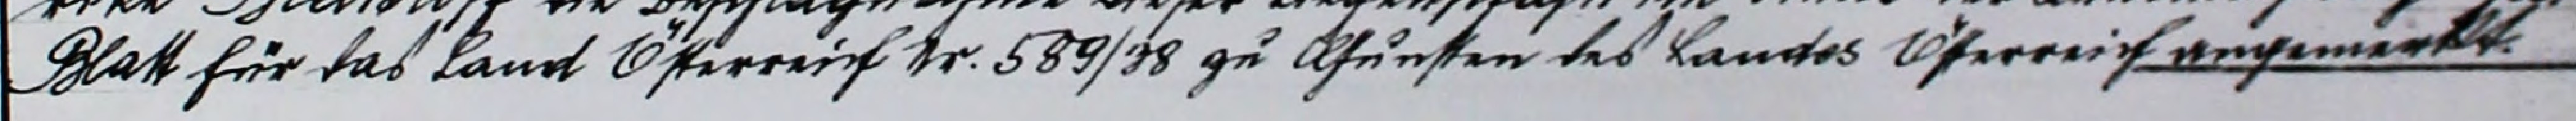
Blatt für das Land Österreich Nr. 589/38 zu Gunsten des Landes Österreich angemerkt.
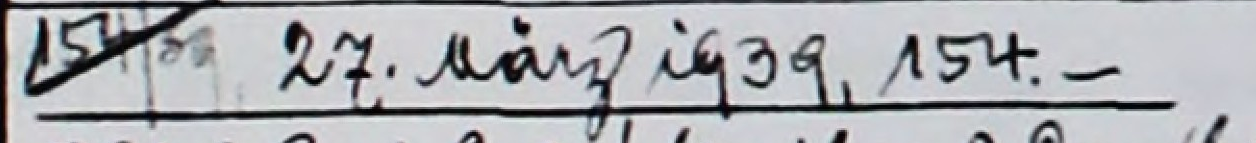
154/39. 27. März 1939, 154. -
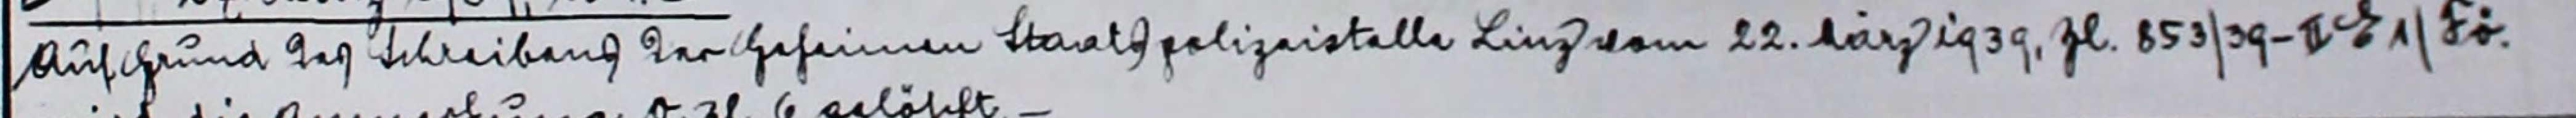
Auf Grund des Schreibans der Geheimen Staats polizeistelle Linz vom 22. März 1939, Zl. 853/39-II E 1/Fö.
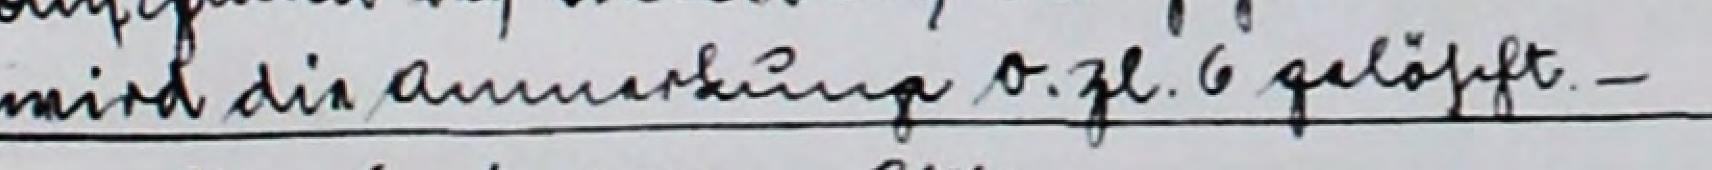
wird die Anmerkung v. zl. 6 gelöscht.-
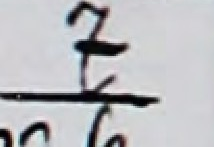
7
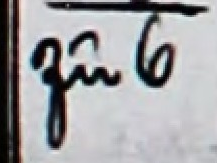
zu 6
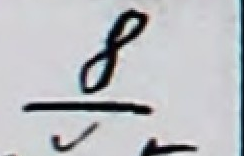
8
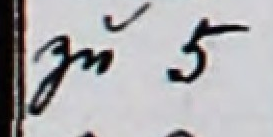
zu 5
